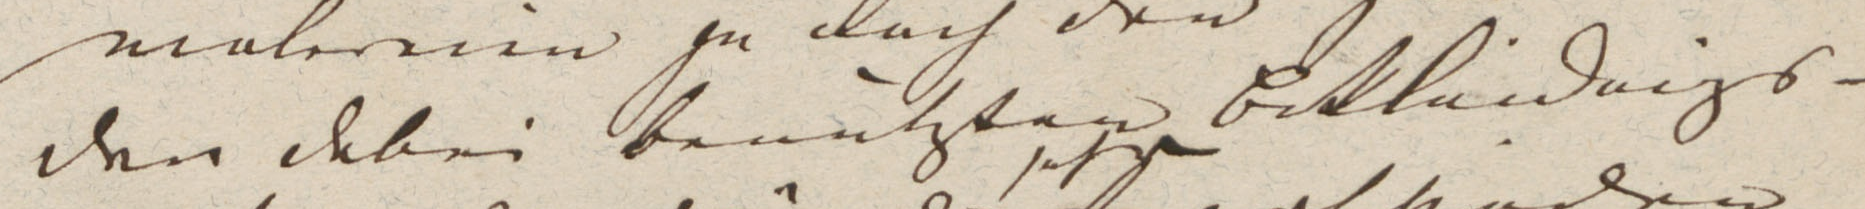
den dabei benutzten Bekleidungs-
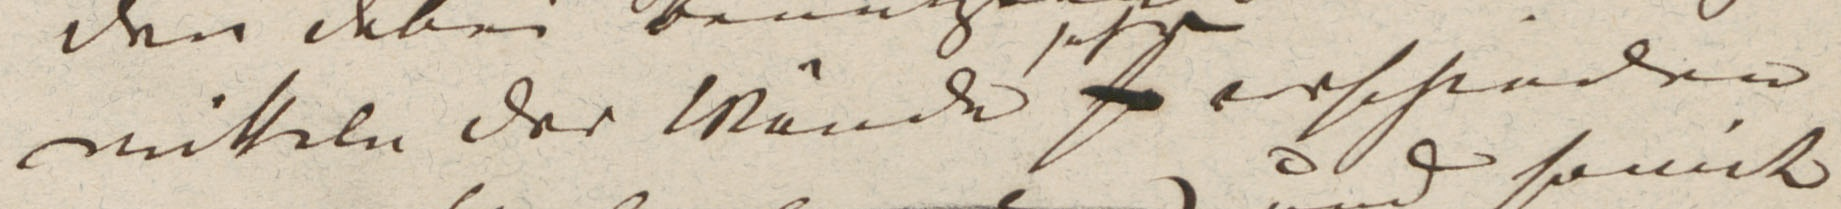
mitteln der Wände so sehr verschieden
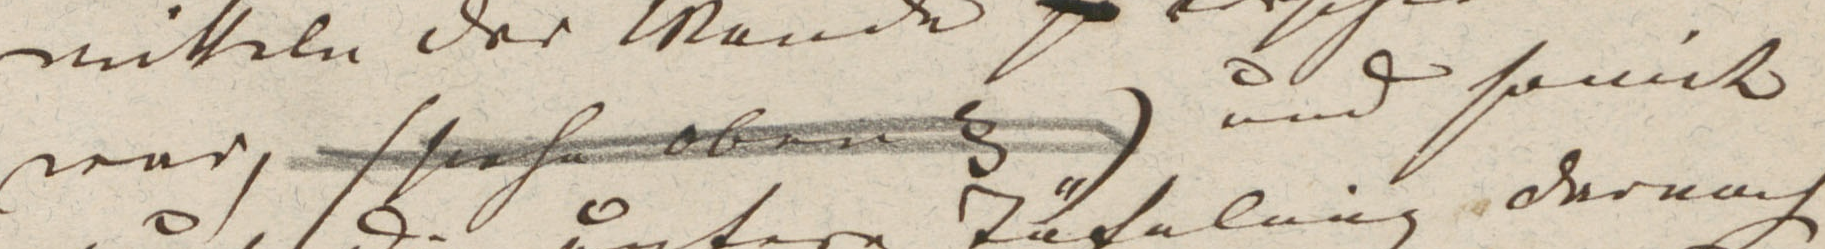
war, (siehe oben § ) und somit
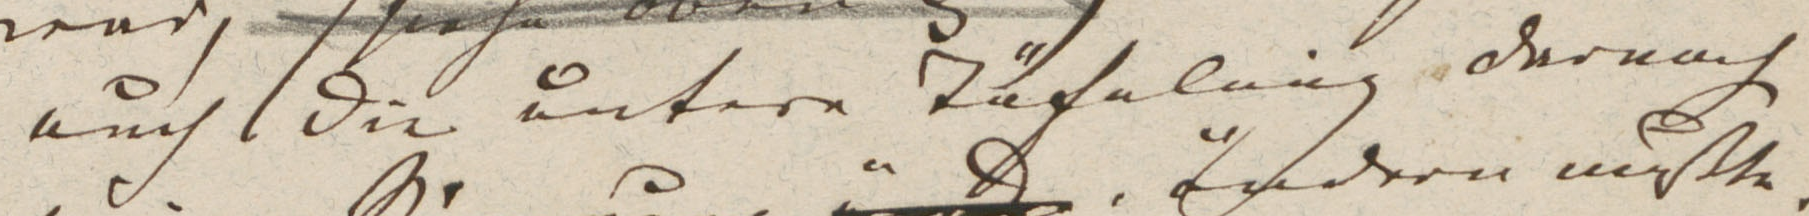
auch die untere Täfelung darnach
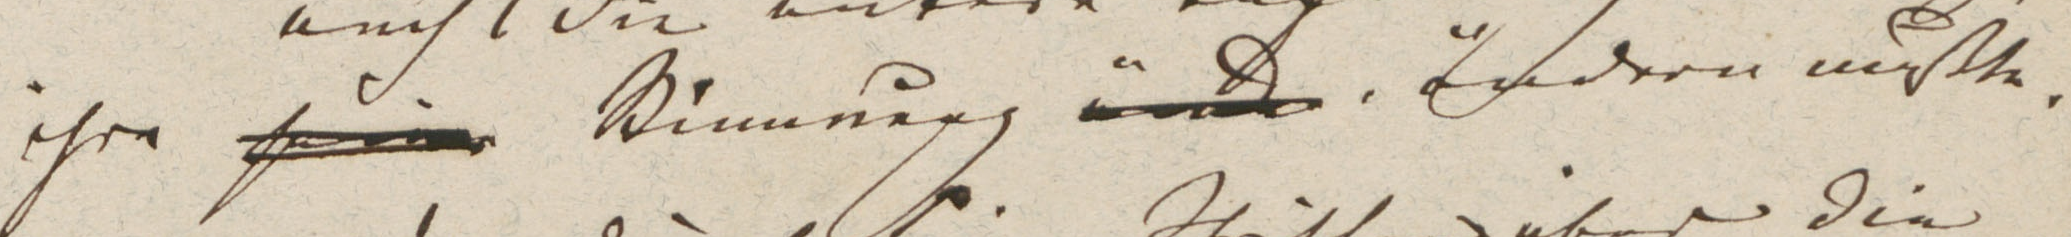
ihre seine Stimmung änd ändern musste.
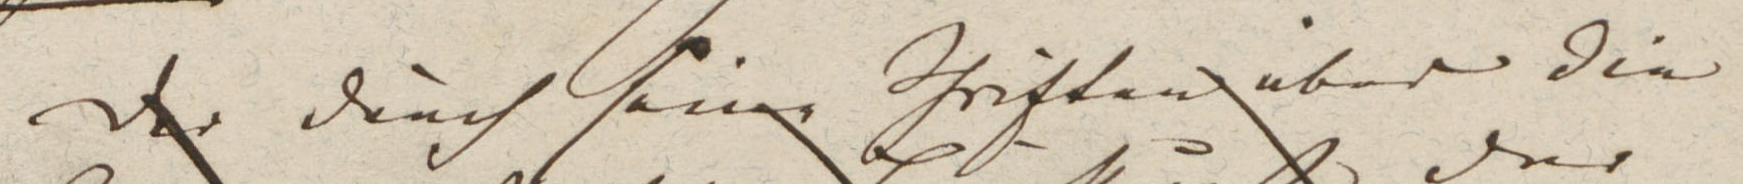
Der durch seine Schriften über die
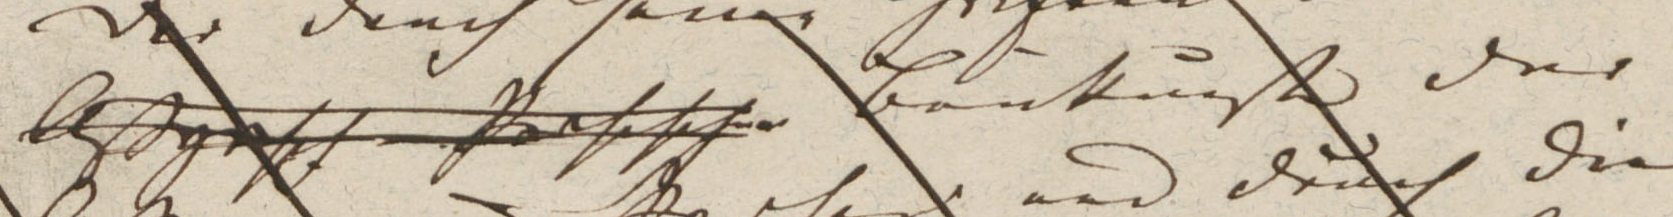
Assyrisch-Persische Baukunst der
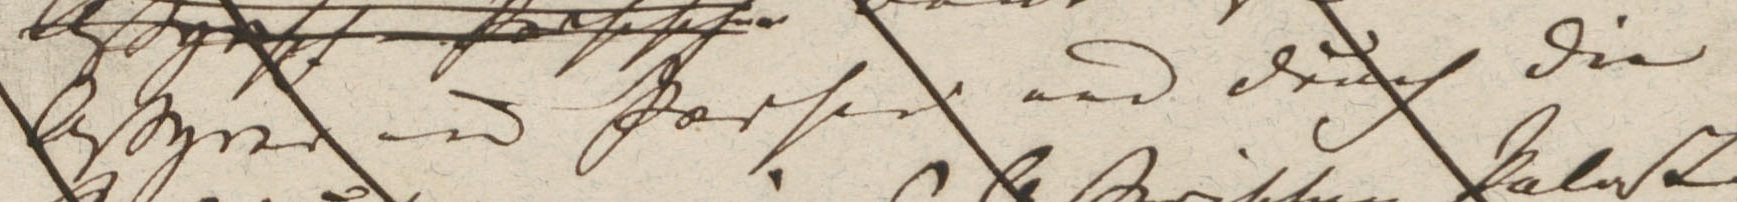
Assyrer und Perser und durch die
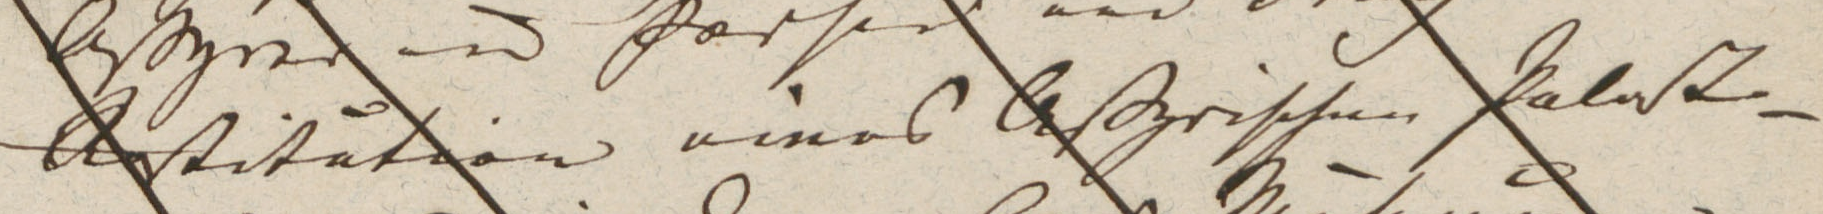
Restitution eines Assyrischen Palast-
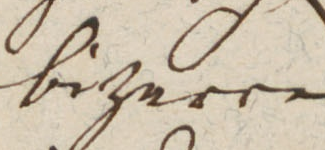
bizarren
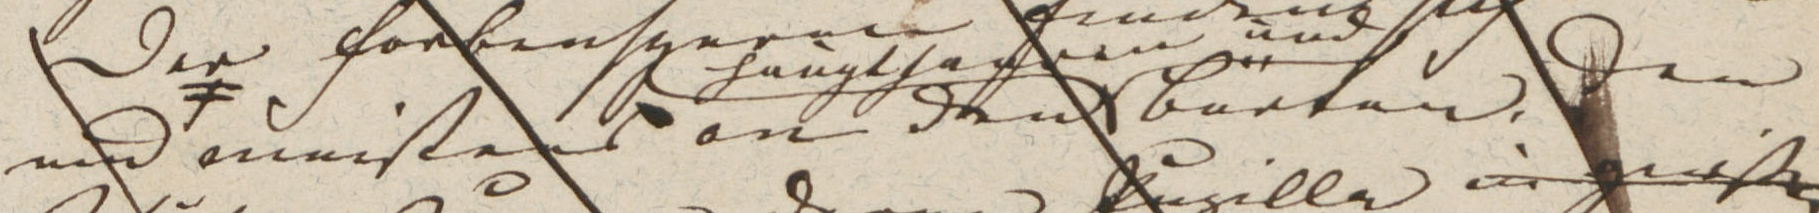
und % meistens an den Haupthaaren und Bärten. den
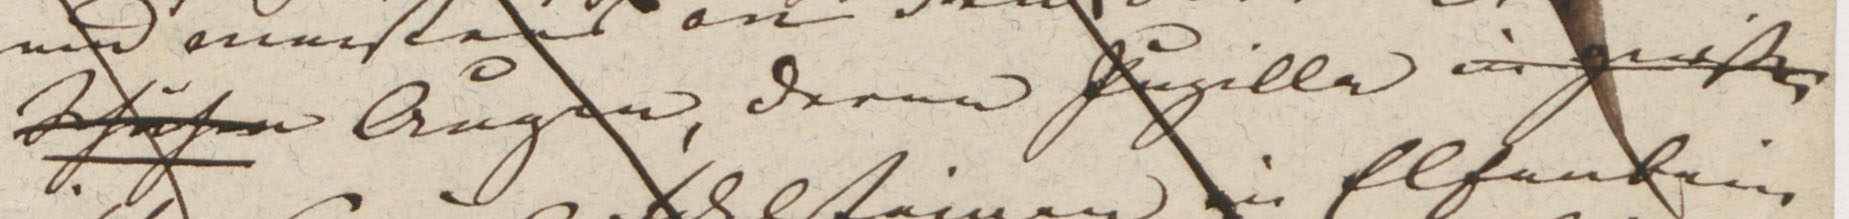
Schuhen Augen, deren Pupille in gewisse
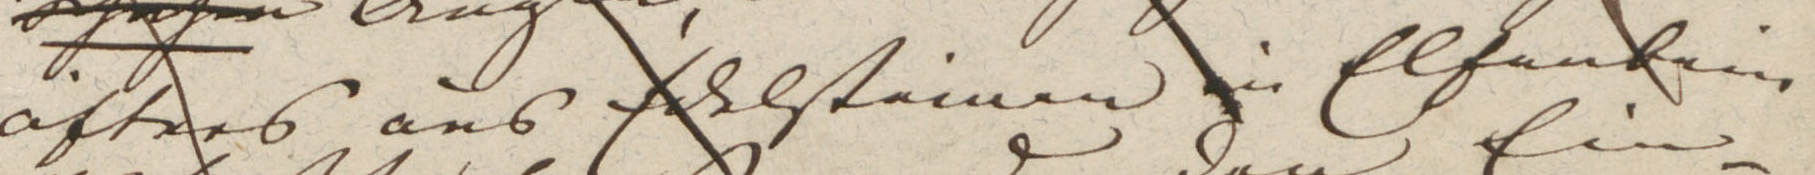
öfters aus Edelsteinen in Elfenbein
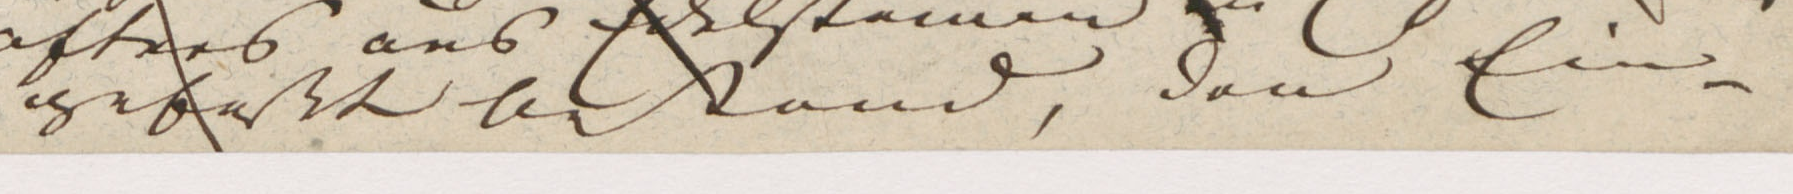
gefasst bestand, den Ein-
